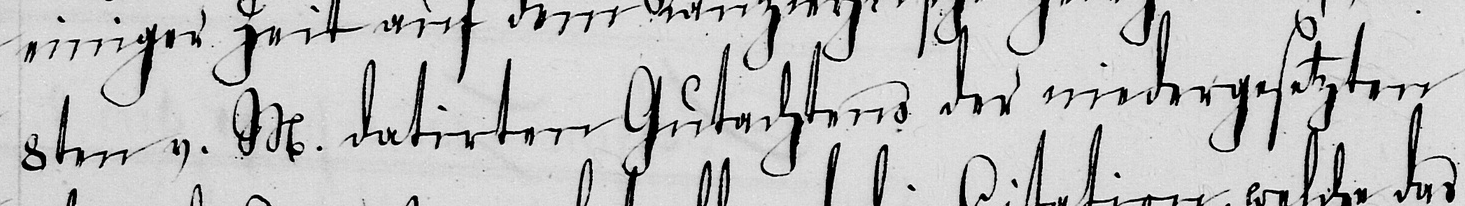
8ten v. M. datirten Gutachtens der niedergesetzten
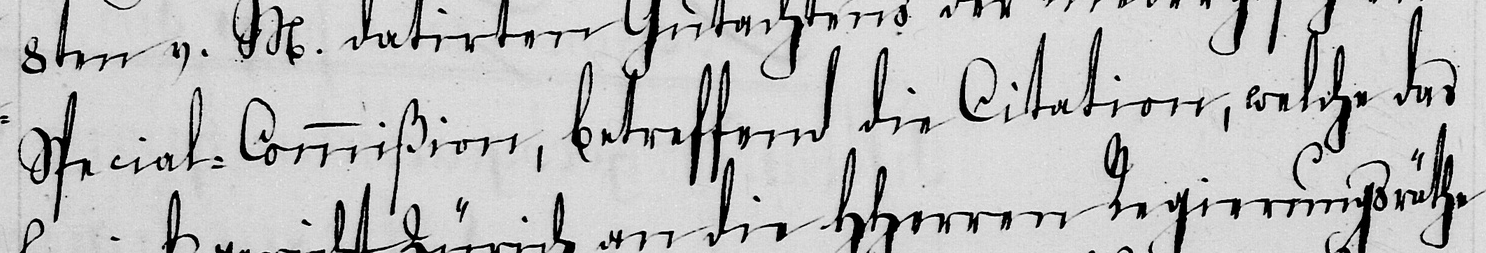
Special-Commißion, betreffend die Citation, welche das
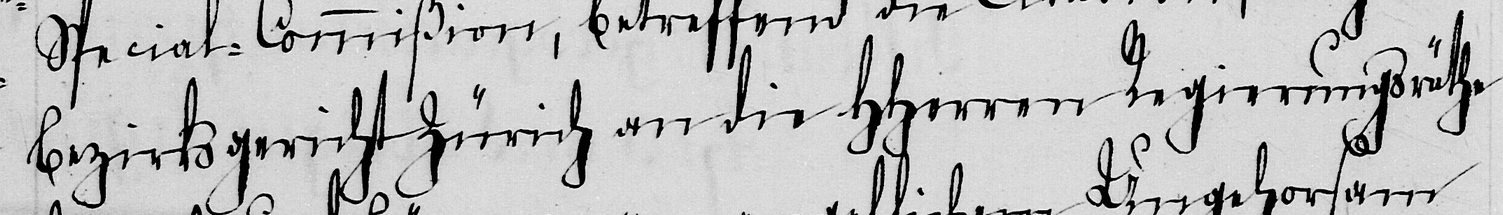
Bezirksgericht Zürich an die HHerren Regierungsräthe
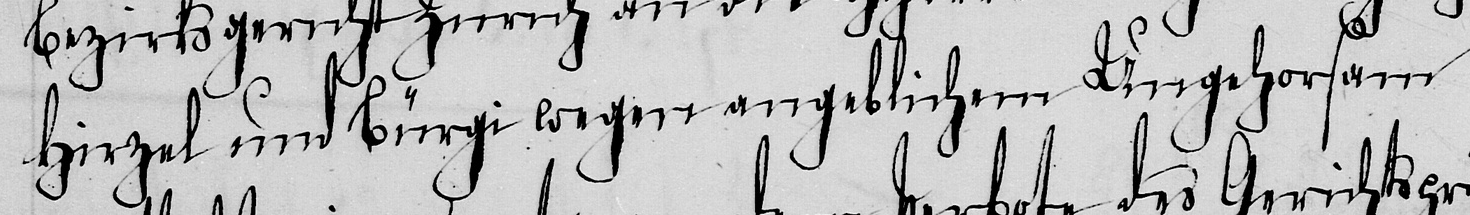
Hirzel und Bürgi wegen angeblichem Ungehorsam
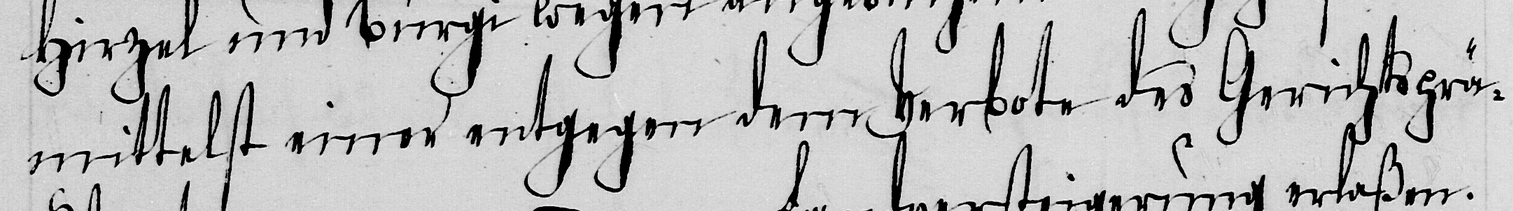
mittelst einer entgegen dem Verbote des Gerichtsprä¬
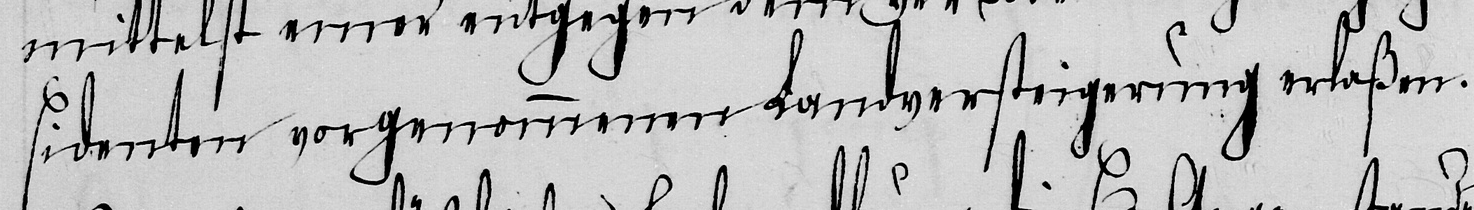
sidenten vorgenommenen Landversteigerung erlaßen.
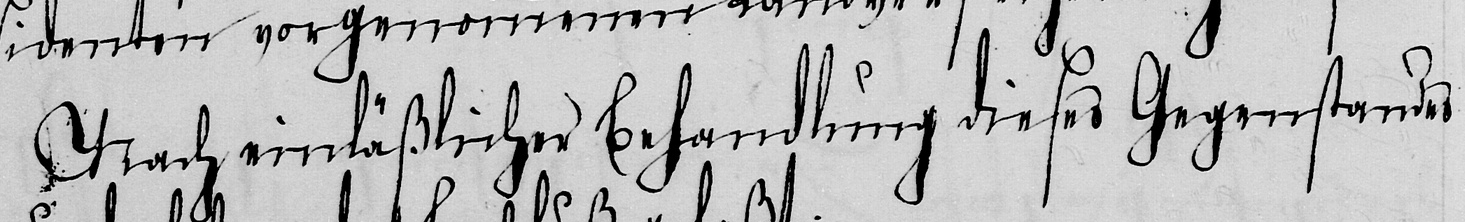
Nach einläßlicher Behandlung dieses Gegenstandes
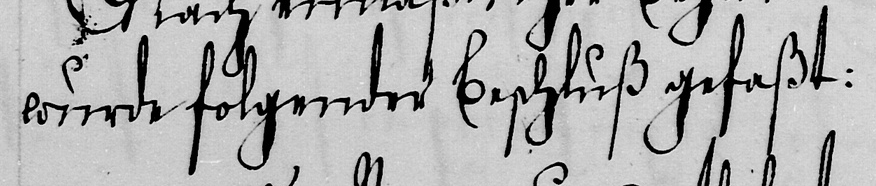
wurde folgender Beschluß gefaßt:
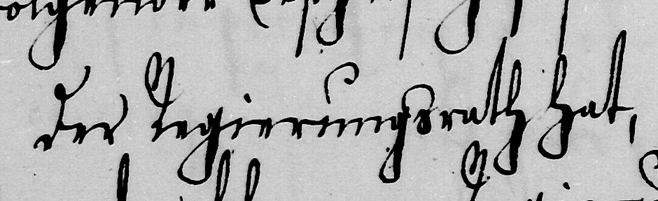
Der Regierungsrath hat,
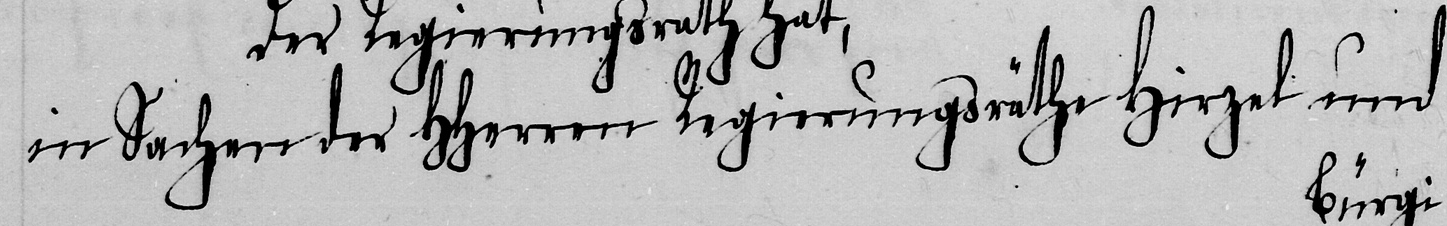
in Sachen der HHerren Regierungsräthe Hirzel und
